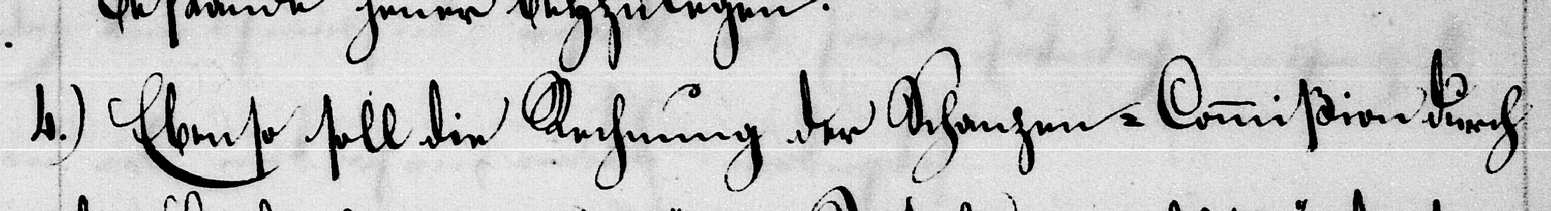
4.) Ebenso soll die Rechnung der Schanzen-Commißion durch
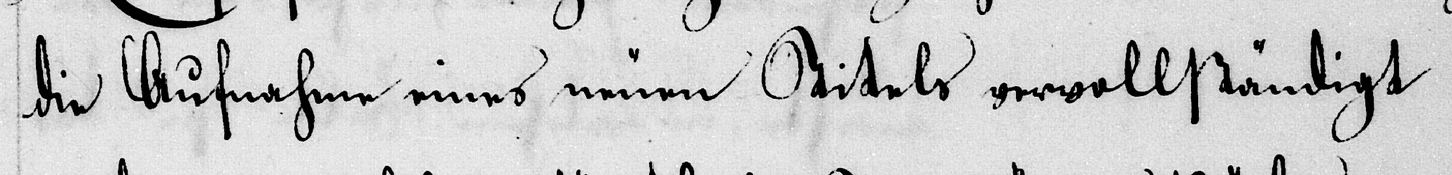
die Aufnahme eines neuen Titels vervollständigt
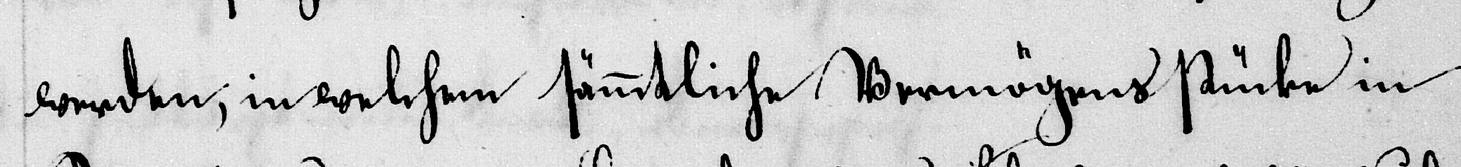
werden, in welchem sämmtliche Vermögensstücke in
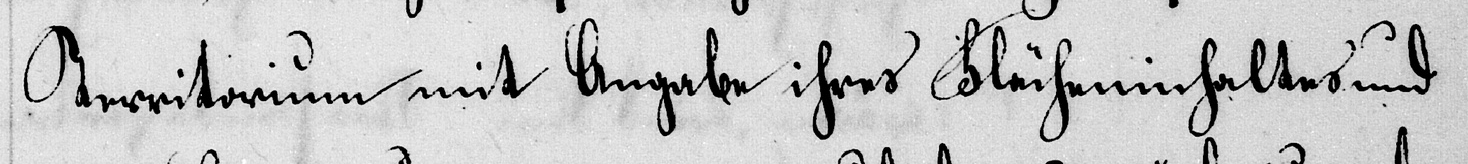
Territorium mit Angabe ihres Flächeninhaltes und
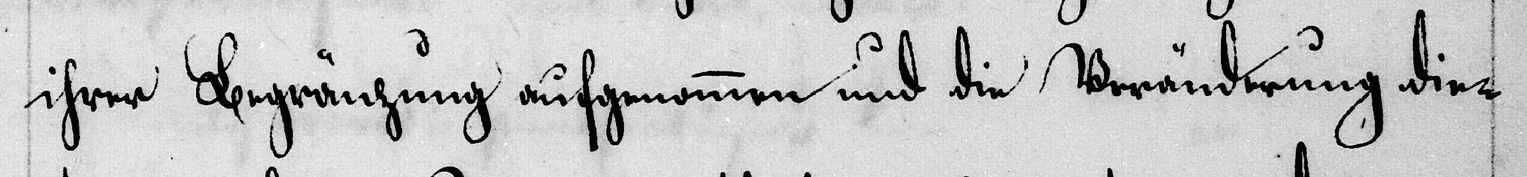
ihrer Begränzung aufgenommen und die Veränderung dies¬
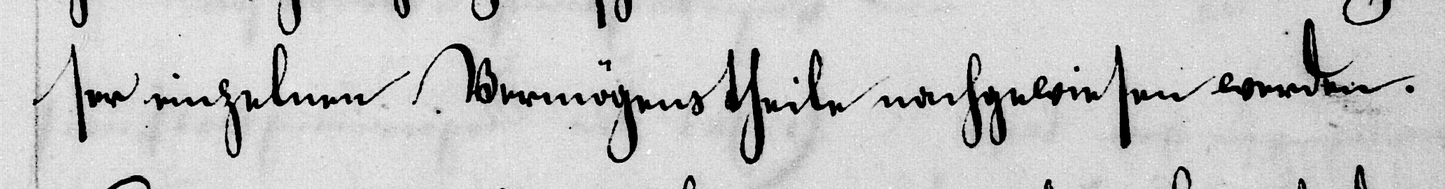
er einzelnen Vermögenstheile nachgewiesen werden.
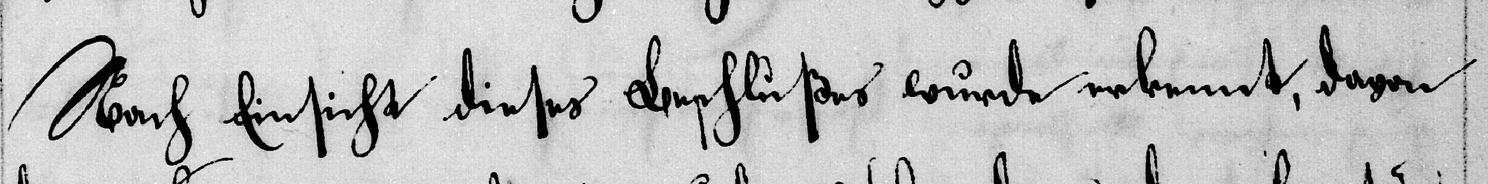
Nach Einsicht dieses Beschlußes wurde erkennt, davon
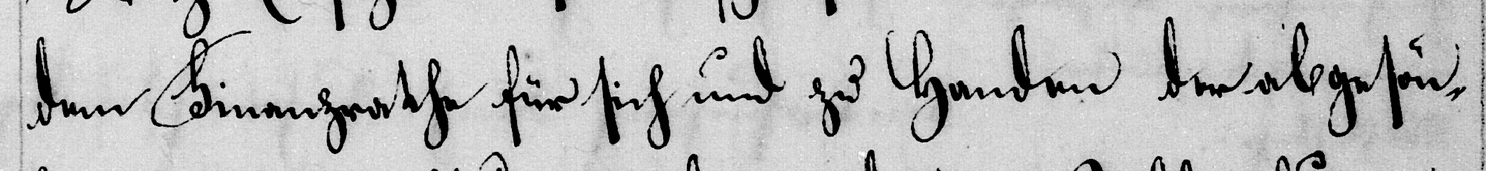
dem Finanzrathe für sich und zu Handen der abgesön¬
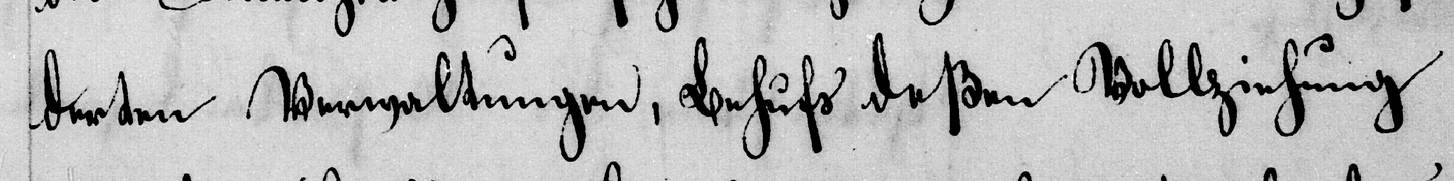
derten Verwaltungen, Behufs deßen Vollziehung
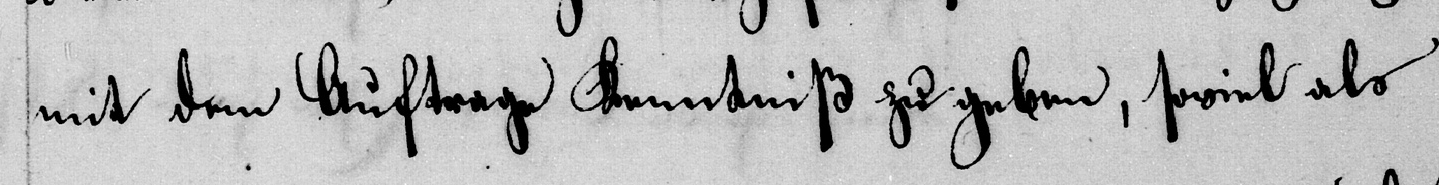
mit dem Auftrage Kenntniß zu geben, sowie als
